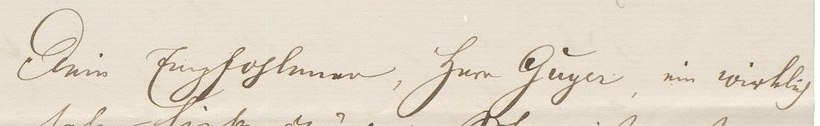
Dein Empfohlener, Herr Guyer, ein wirklich
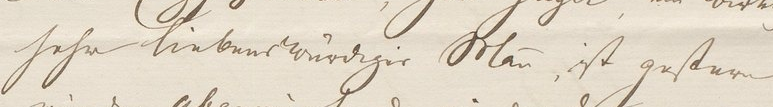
sehr liebenswürdiger Mann, ist gestern
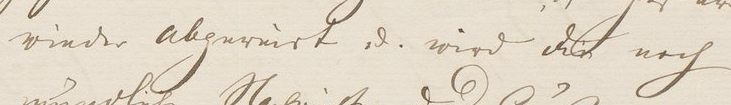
wieder abgereist u. wird Dir noch
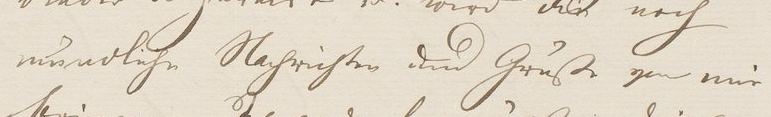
mündliche Nachrichten und Grüße von mir
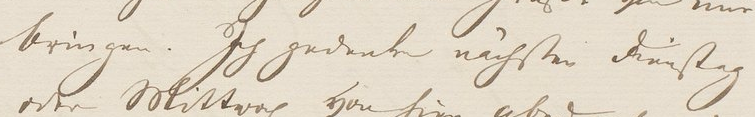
bringen. Ich gedenke nächsten Dienstag
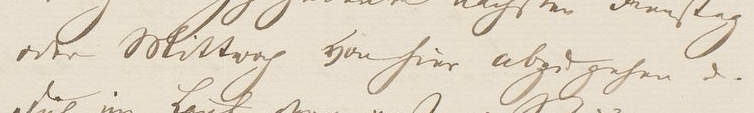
oder Mittwoch von hier abzugehen u.
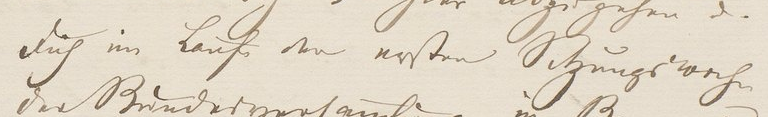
Dich im Laufe der ersten Sitzungstzungswoche
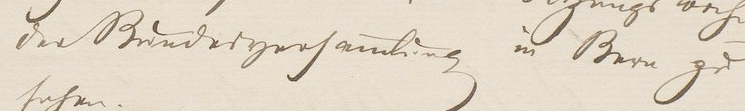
der Bundesversammlung in Bern zu
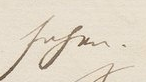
sehen.
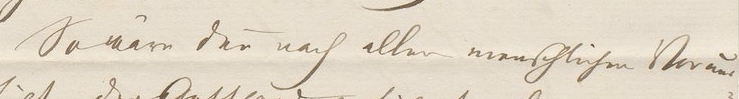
So wäre denn nach aller menschlichen Voraus-
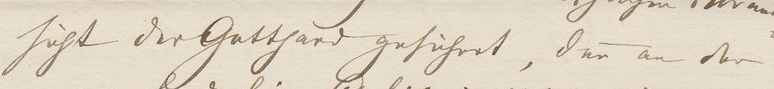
sicht der Gotthard gesichert, denn an der
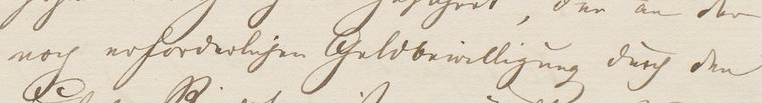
noch erforderlichen Geldbewilligung durch den
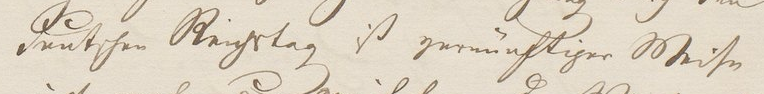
Deutschen Reichstag ist vernünftiger Weise
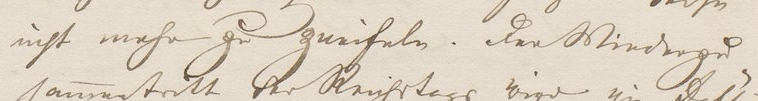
nicht mehr zu zweifeln. Der Wiederzu-
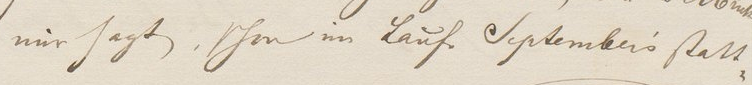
mir sagt, schon im Laufe September's statt-
